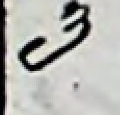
3
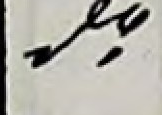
Do
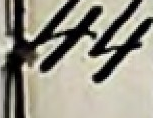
44
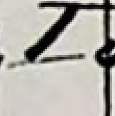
I
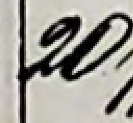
20
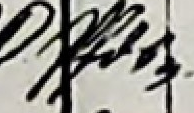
Pfds„
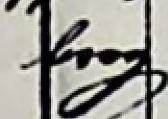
berg
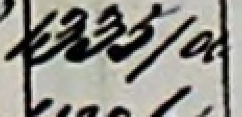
1335/a
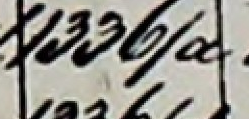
1336/a
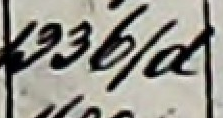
1336/d
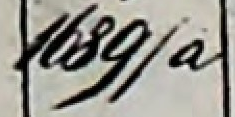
1689/a
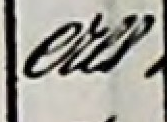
Alt
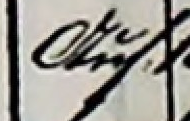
Aus
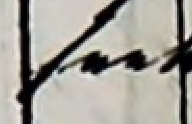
see
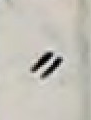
„
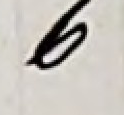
6
